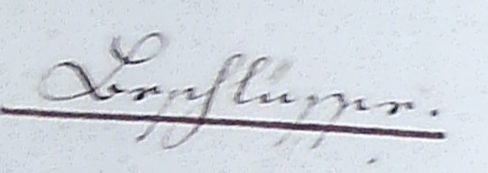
Beschlüsse.
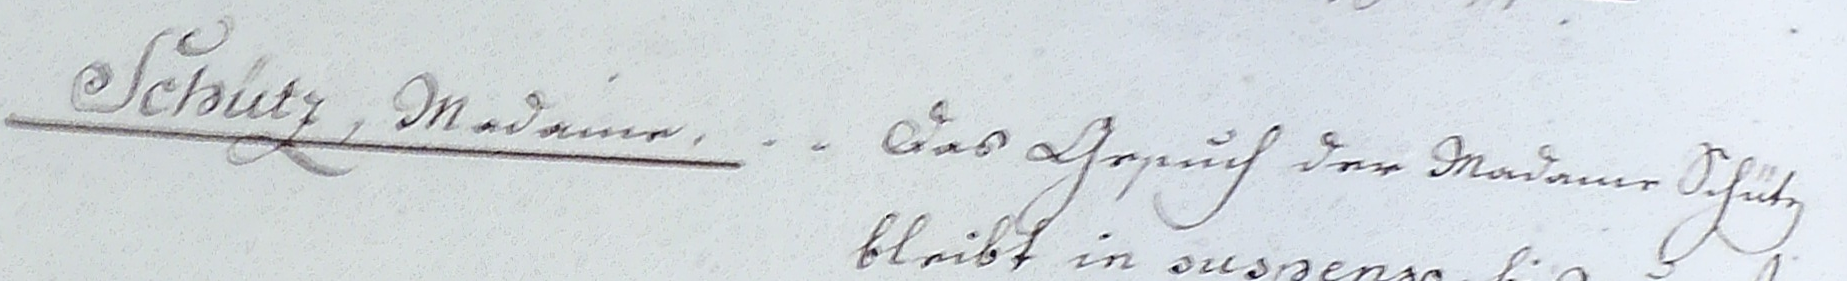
Schütz, Madame. . .. Des Gesuch der Madame Schütz
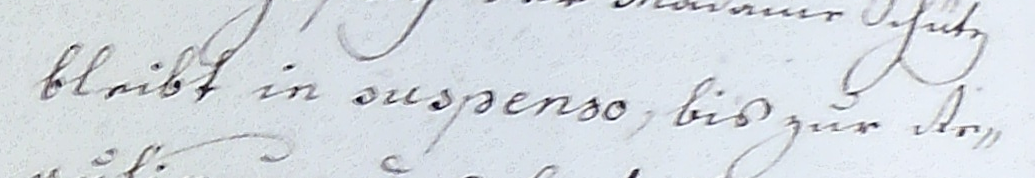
bleibt in suspenso, bis zur Re¬
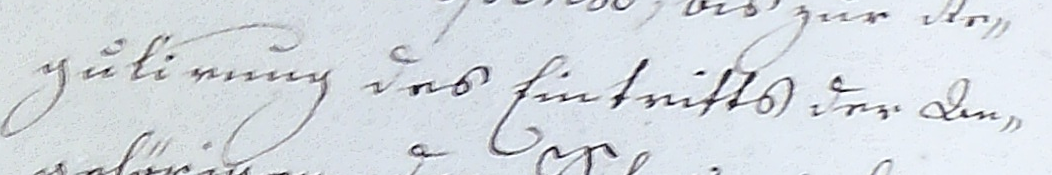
gulirung des Eintritts der An¬
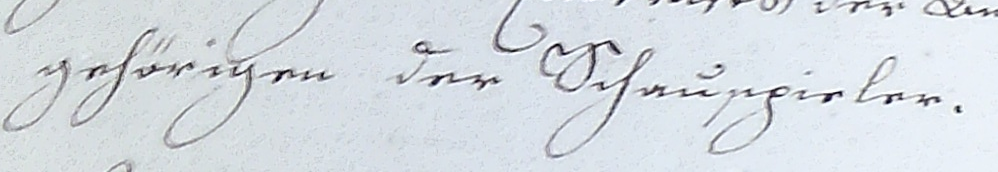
gehörigen der Schauspieler.
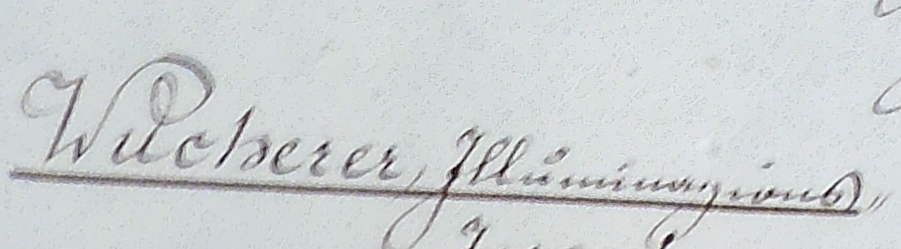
Wucherer, Illuminazions¬
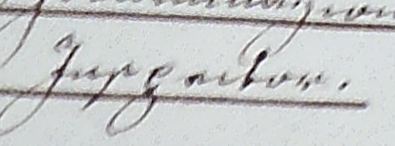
Inspector.
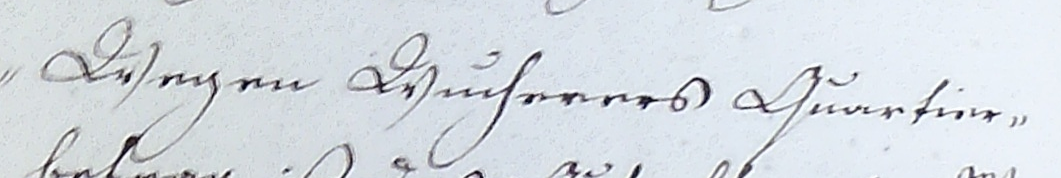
Wegen Wucherers Quartier¬
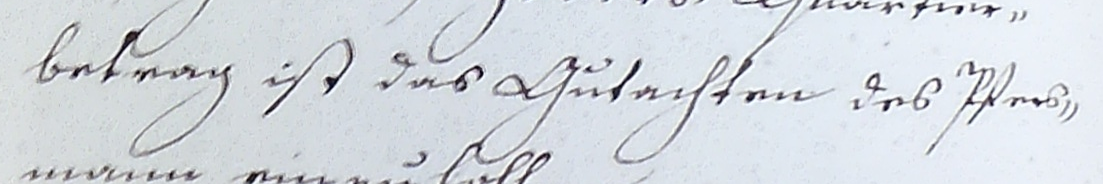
betrag ist das Gutachten des Pfers¬
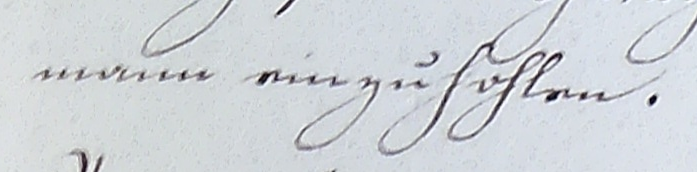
mann einzuhohlen.
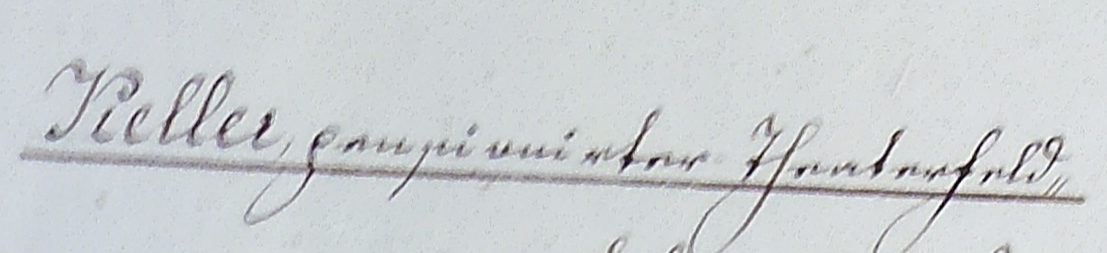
Keller, pensionirter Theaterfeld¬
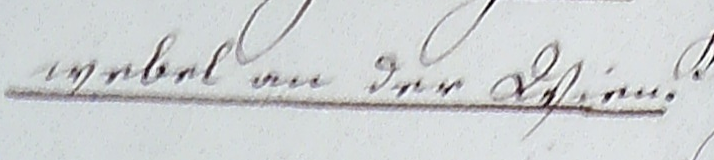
webel an der Wien.
